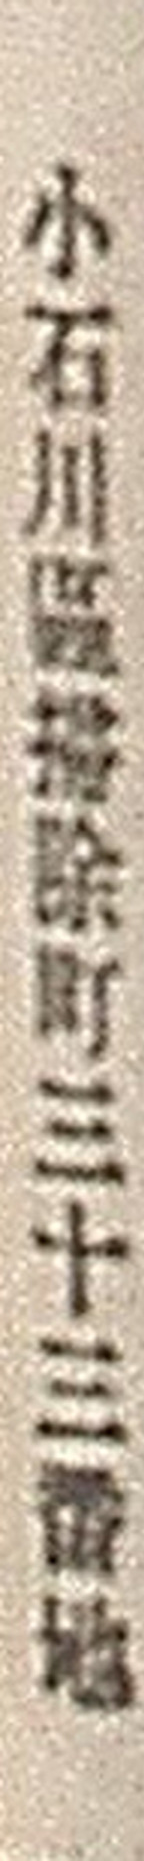小石川区掃除町三十三番地

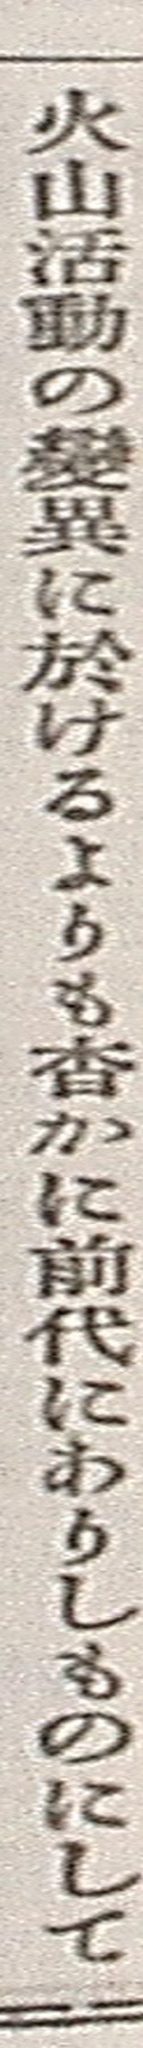火山活動の変異に於けるよりも杳かに前代にありしものにして
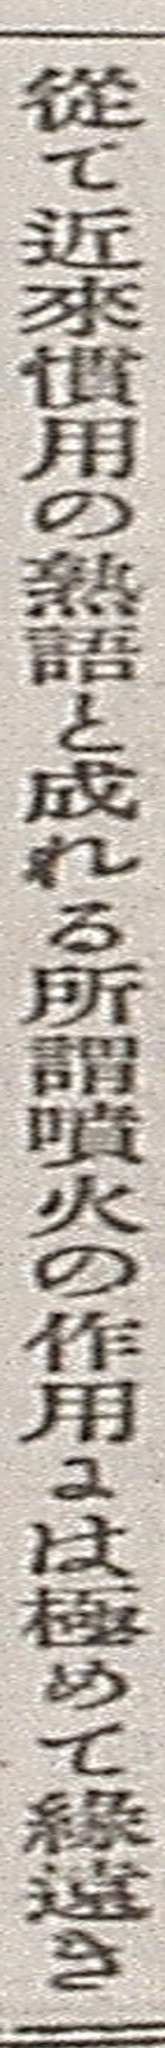従て近来慣用の熟語と成れる所謂噴火の作用には極めて縁遠き
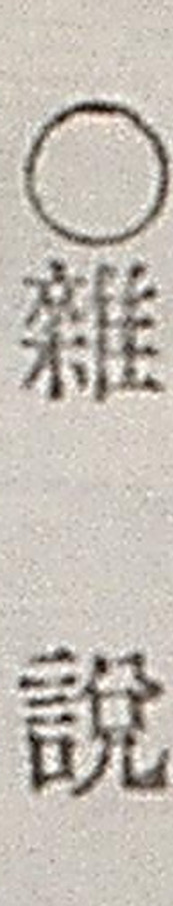○雑説
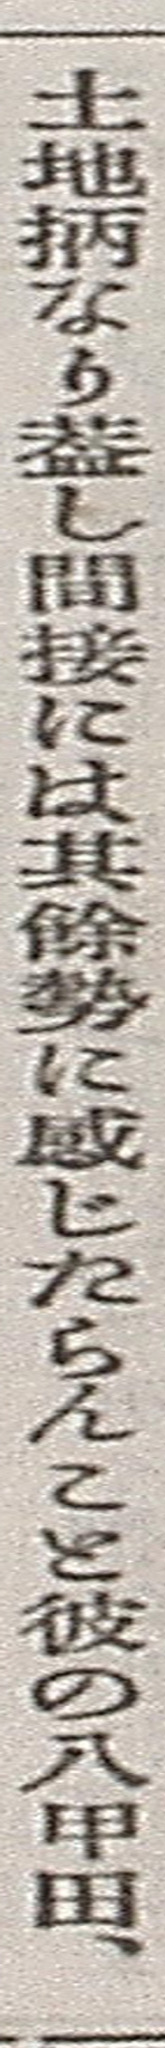土地柄なり蓋し間接には其余勢に感じたらんこと彼の八甲田、
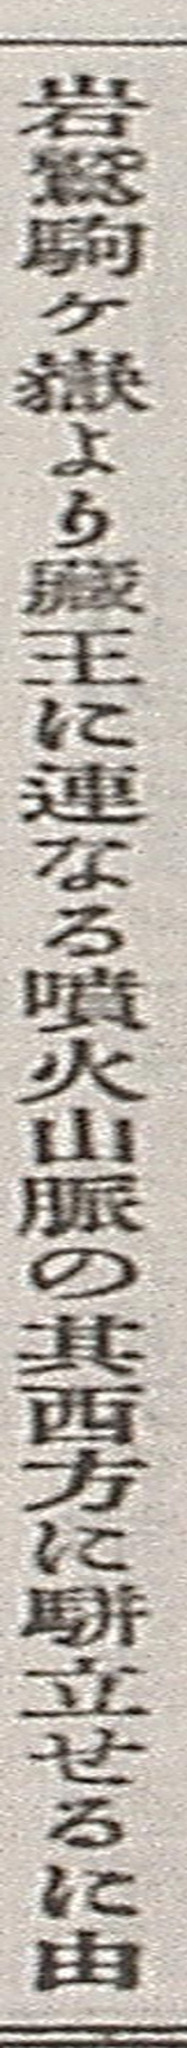岩鷲駒ヶ嶽より蔵王に連なる噴火山脈の其西方に駢立せるに由
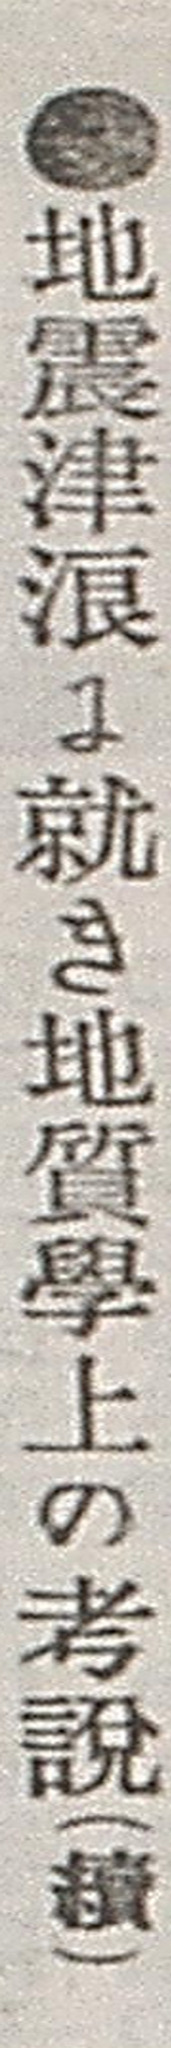●地震津浪に就き地質学上の考説
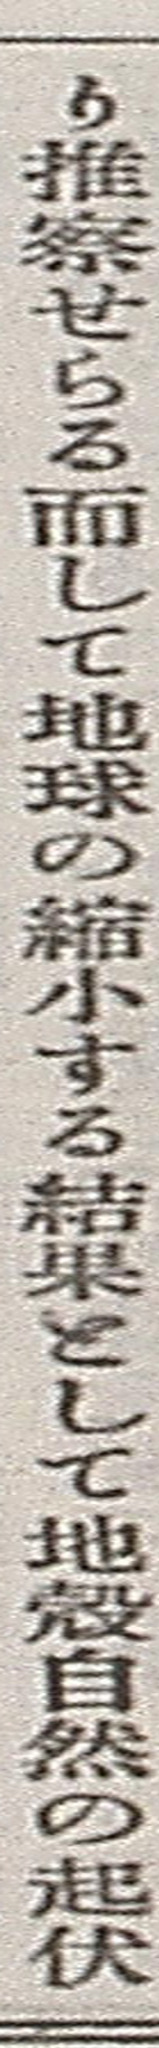り推察せらる而して地球の縮小する結果として地殻自然の起伏
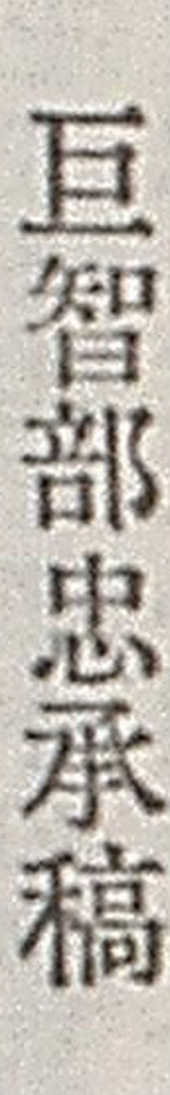巨智部忠承稿
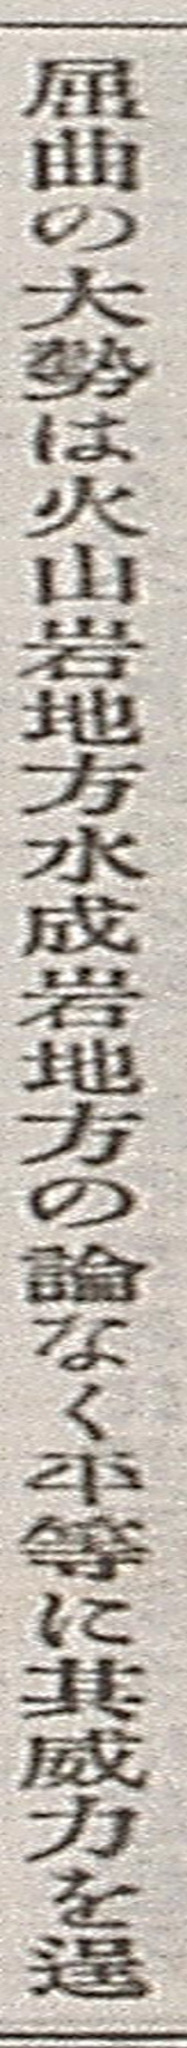屈曲の大勢は火山岩地方水成岩地方の論なく平等に其威力を逞
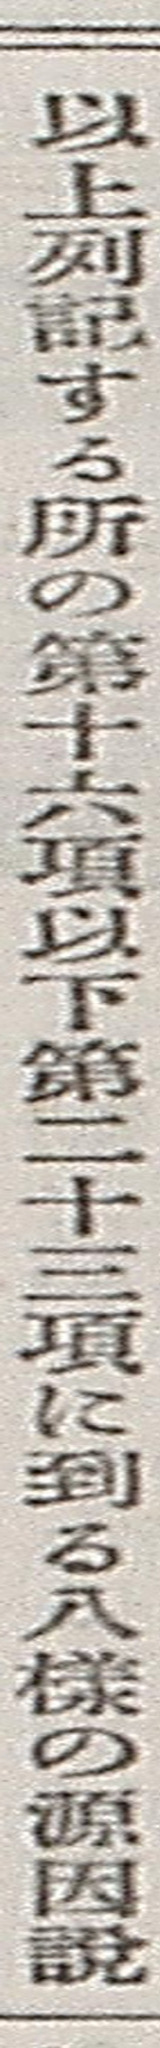以上列記する所の第十六項以下第二十三項に到る八様の源因説
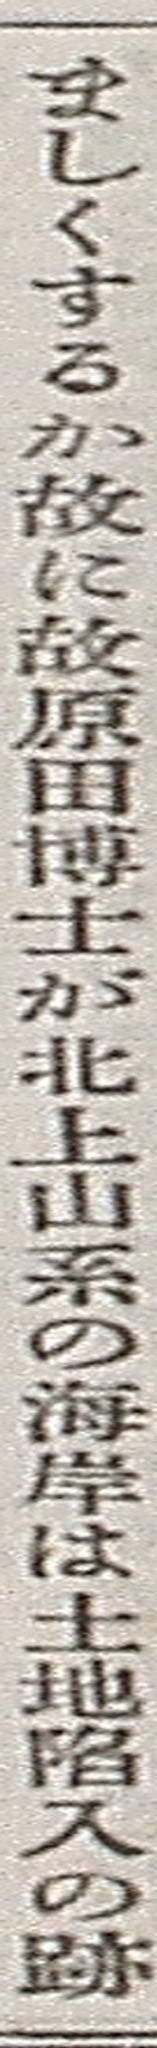ましくするか故に故原田博士が北上山系の海岸は土地陥入の跡
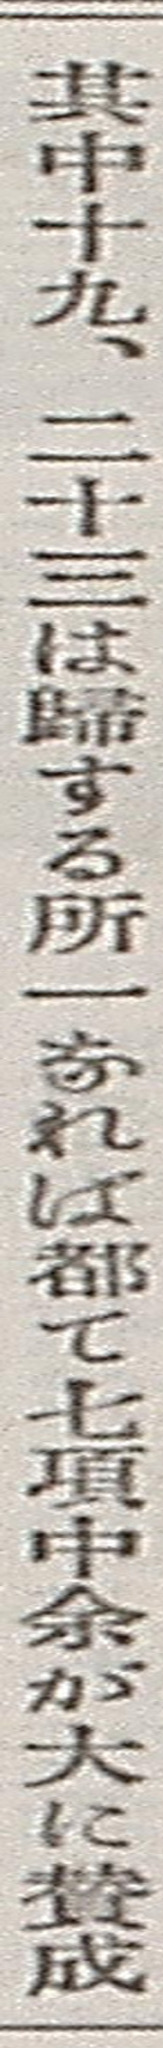其中十九、二十三は帰する所一なれば都て七項中余が大に賛成
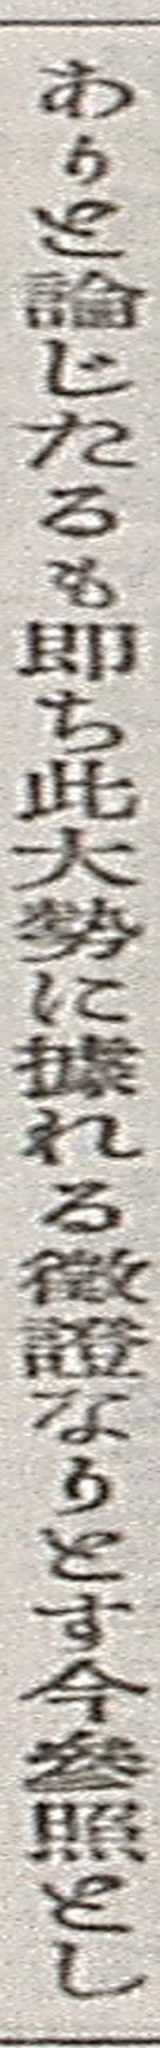ありと論じたるも即ち此大勢に拠れる微証なりとす今参照とし
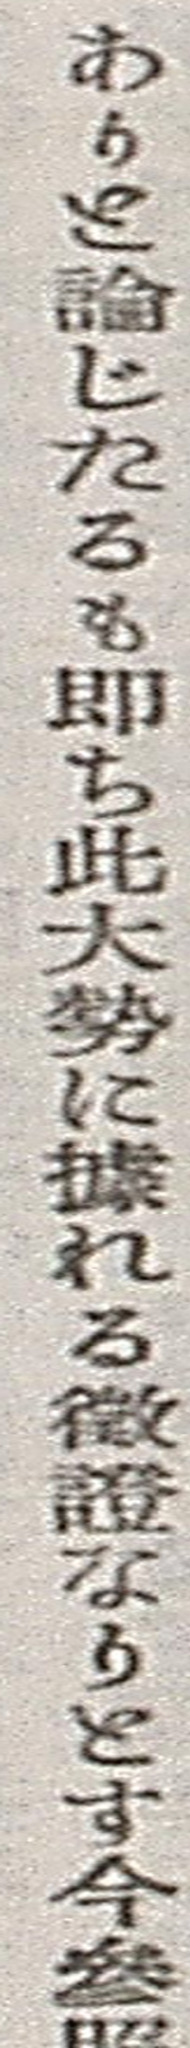ありと論じたるも即ち此大勢に拠れる微証なりとす今参照とし
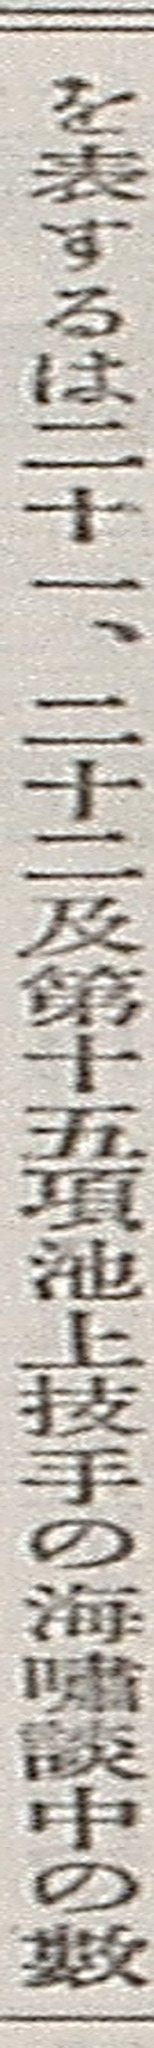を表するは二十一、二十二及第十五項池上技手の海嘯談中の数
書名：風俗畫報臨時増刊第百二十號　大海嘯被害録（下）
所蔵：東京大学地震研究所図書室 Earthquake Research Institute Library, The University of Tokyo, JAPAN
